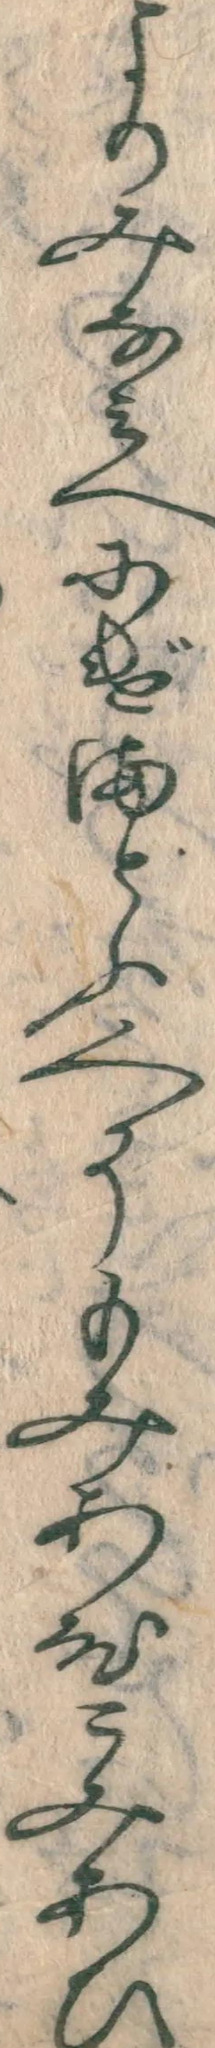よりみなみへにげまとふ人にもみあひこみあひ
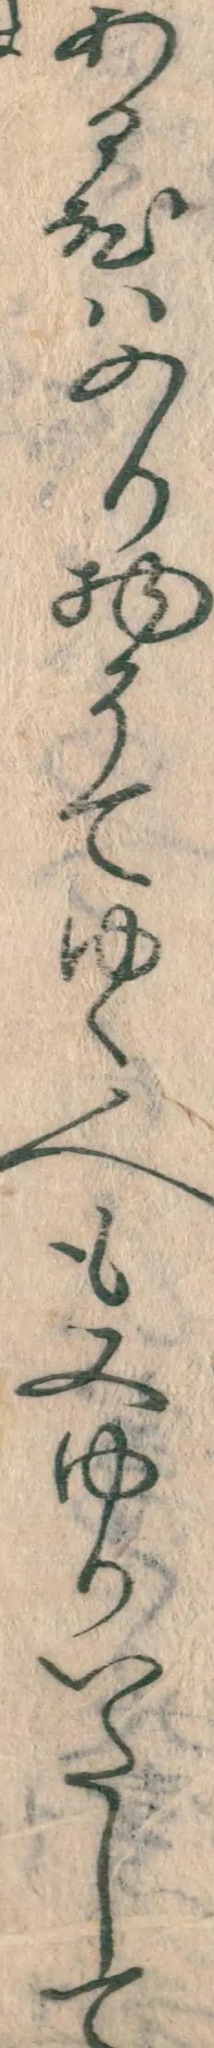あるひはのり物にてゆく人も又ゆりいたして
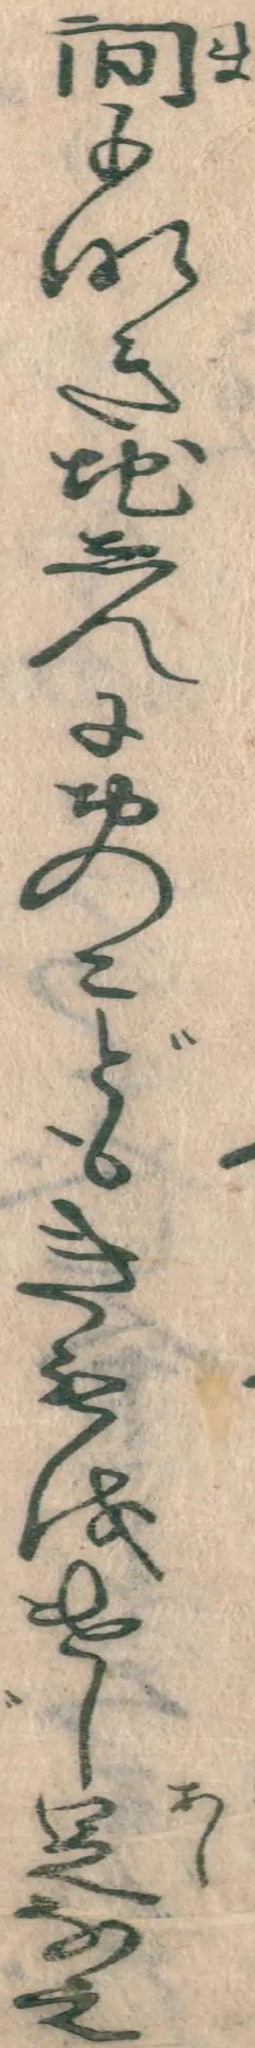間もなき地しんにおのこどもきもをけし足なえ
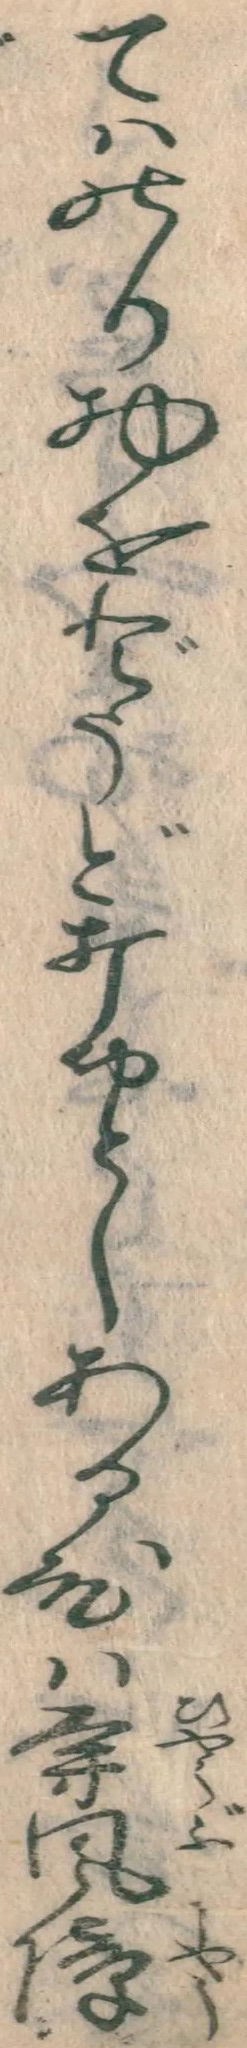てはのり物をどうど打おとしあるひは屏風障
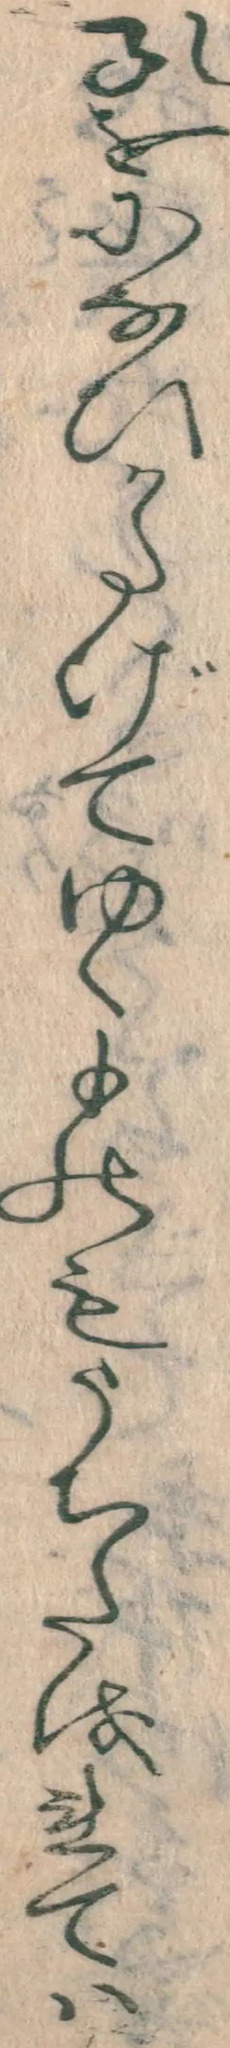子をになひかたげてゆくものもうちたをれては
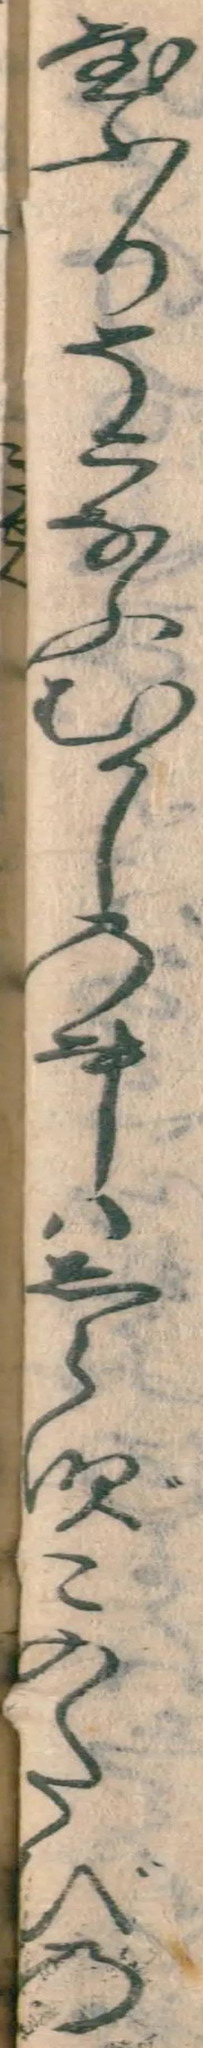やふりそこなふむかしの事はしらすこのたびの
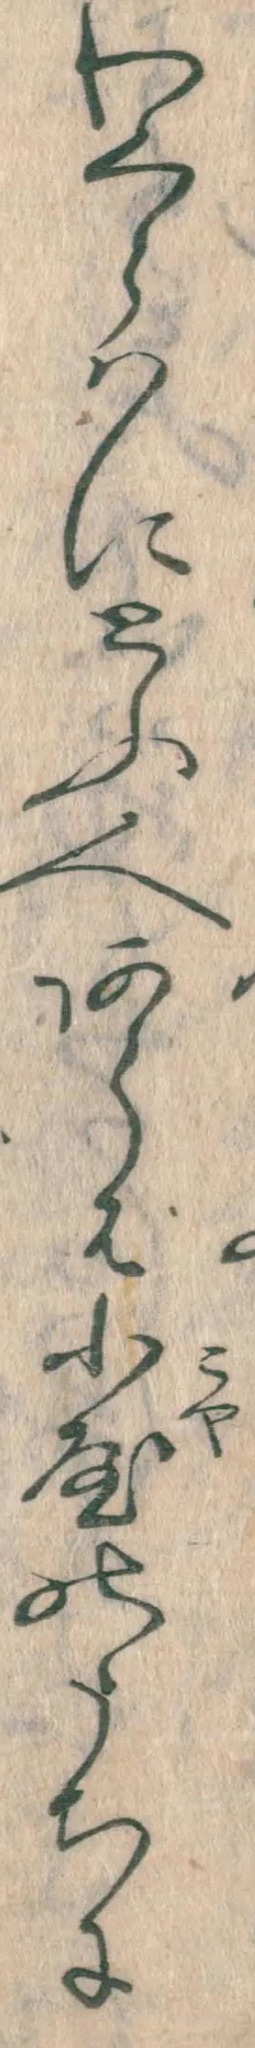わくらはにとふ人あらは小屋のうちに
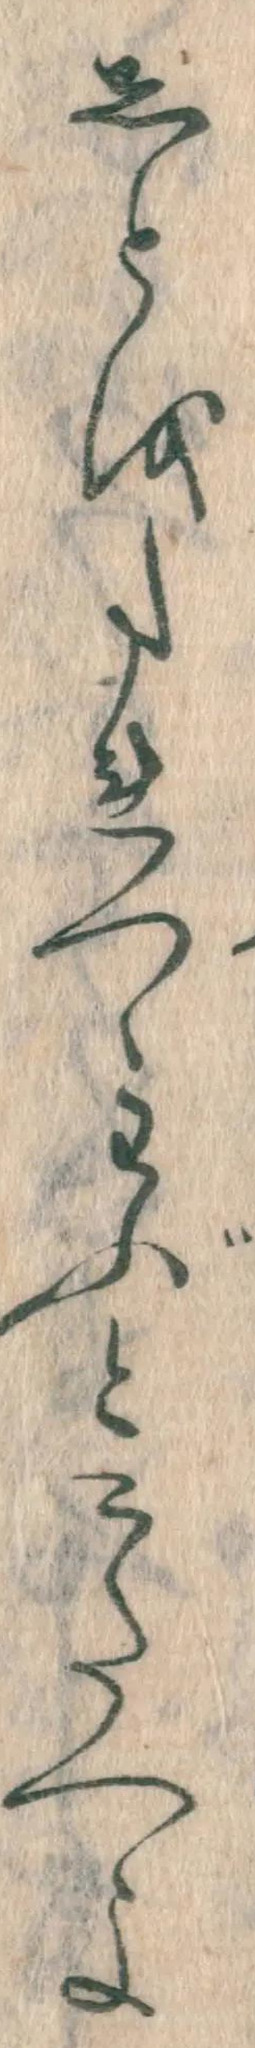ひとをたれつゝわぶとこたへよ
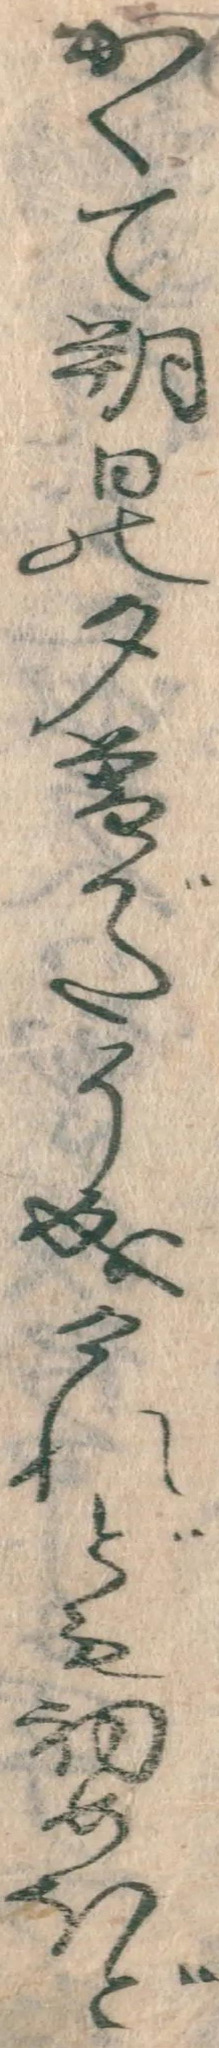かくて朔日の夕暮がたに成けれども初めほど
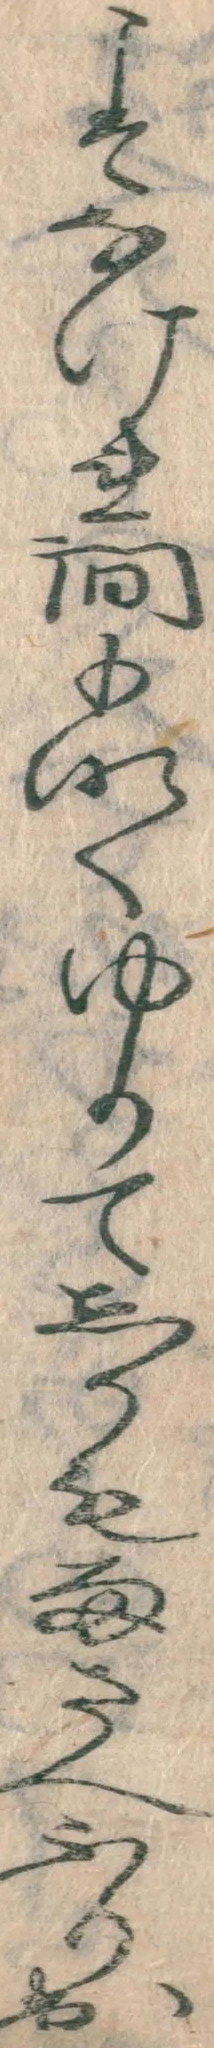こそなけれ間もなくゆりてしかも雨さへふり出
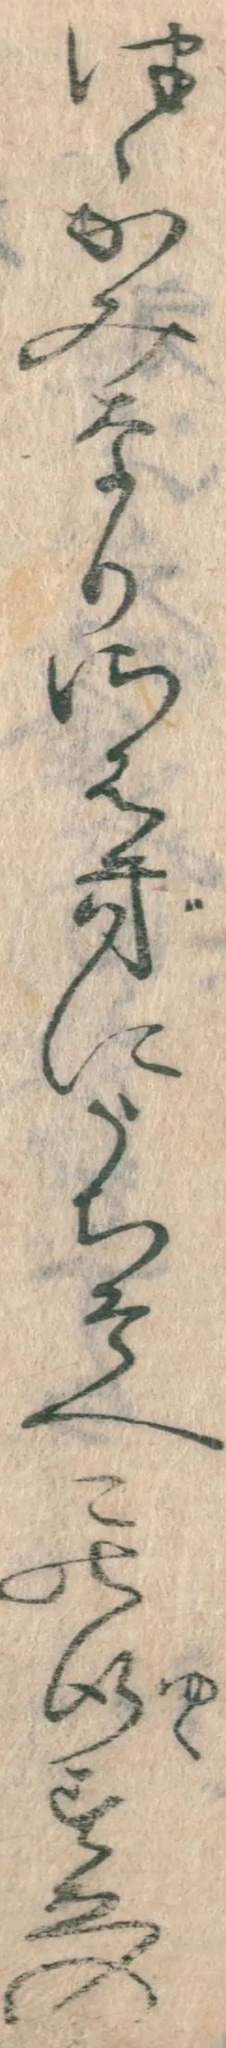つゝかみなりさはぎにうちそえこの行すえの
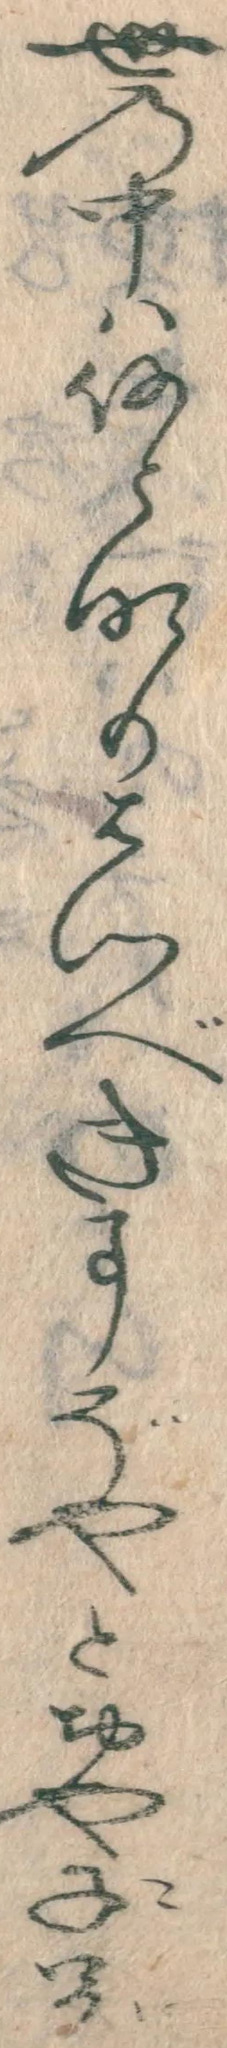世の中は何となもはつべき事ぞやとおや子兄
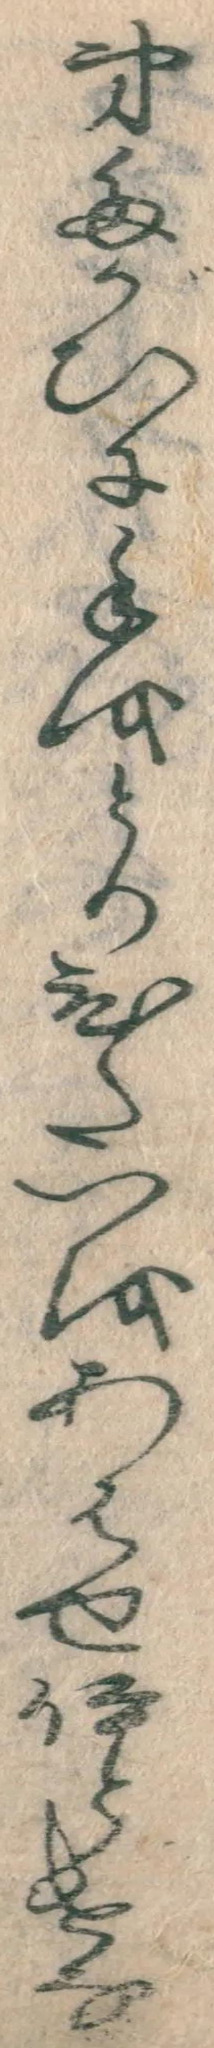弟たがひに手をとりひたいをあはせいとけな
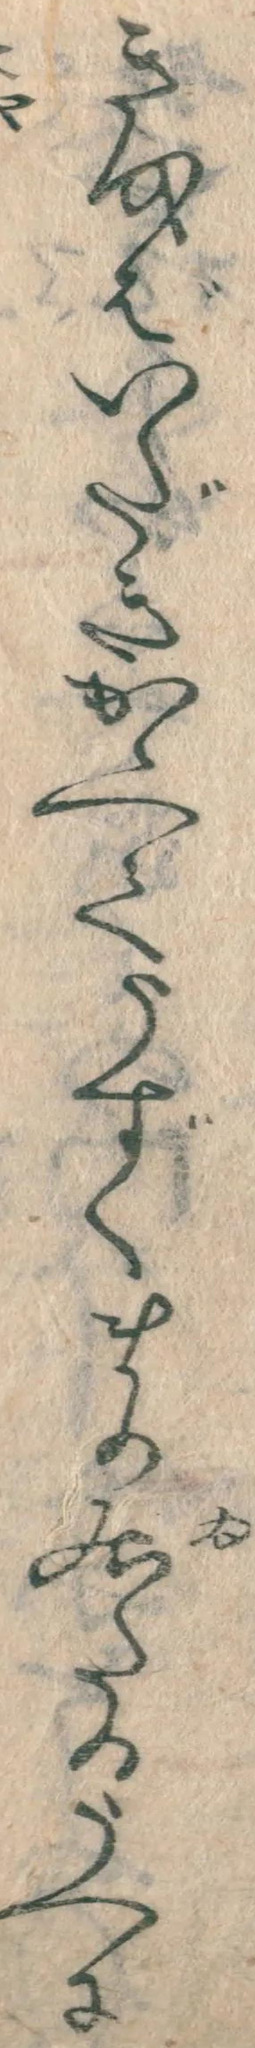き成ばいだきかゝへてうずくまり居たるうへに
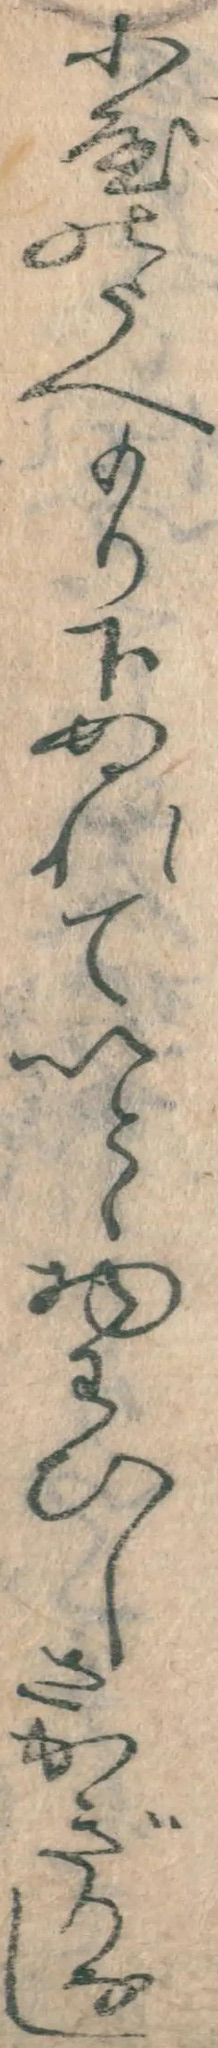小屋のうへもり下ぬれていとゝ物わひしさかぎりなし

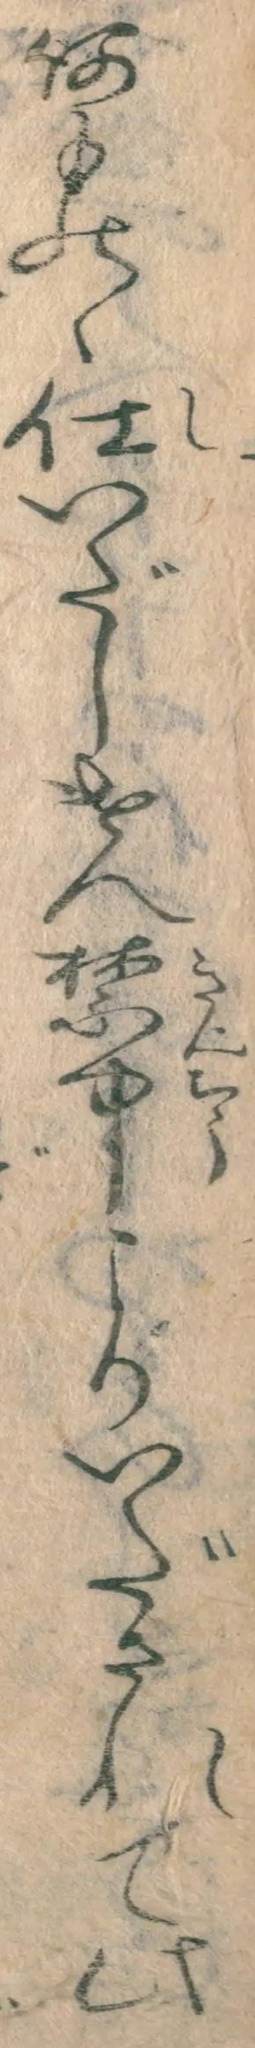何ものゝ仕いだしけん禁中よりいだされて此
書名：艱難目異志. 上,下
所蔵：国立国会図書館 National Diet Library, JAPAN
